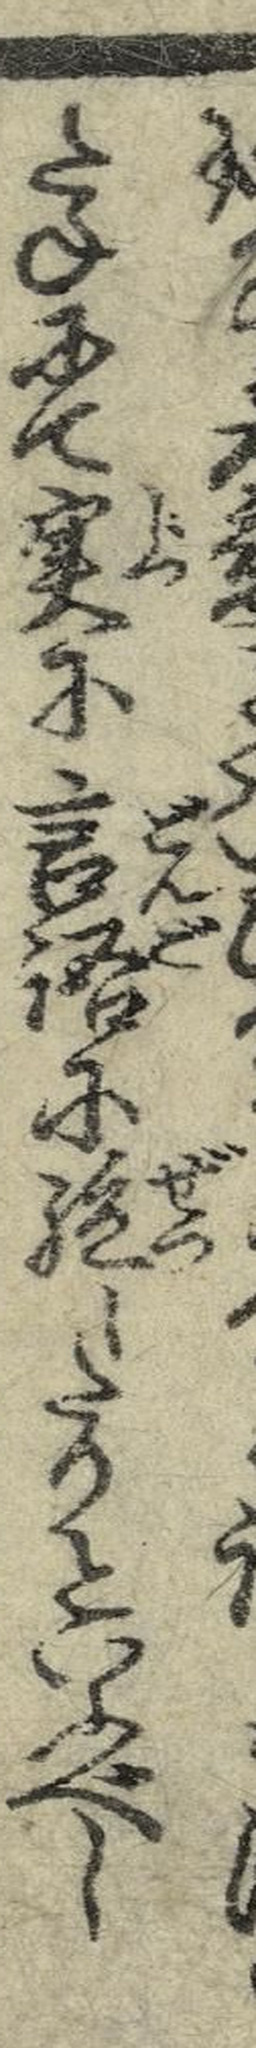たねにて実に言語に絶したりといふべし
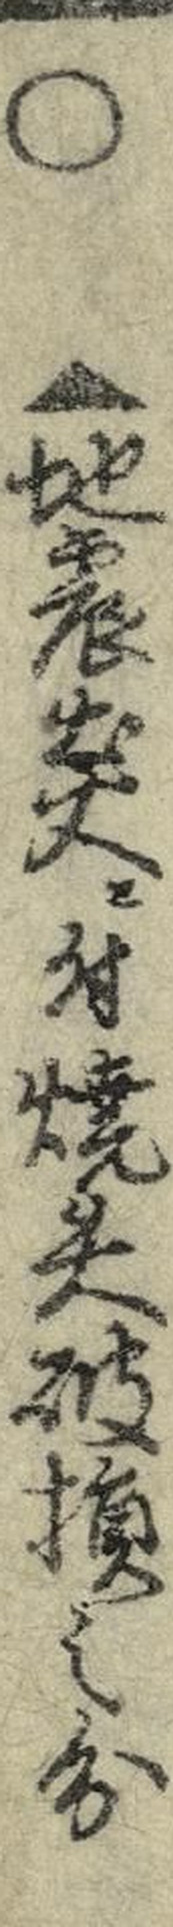○▲地震出火ニ付焼失破損之分

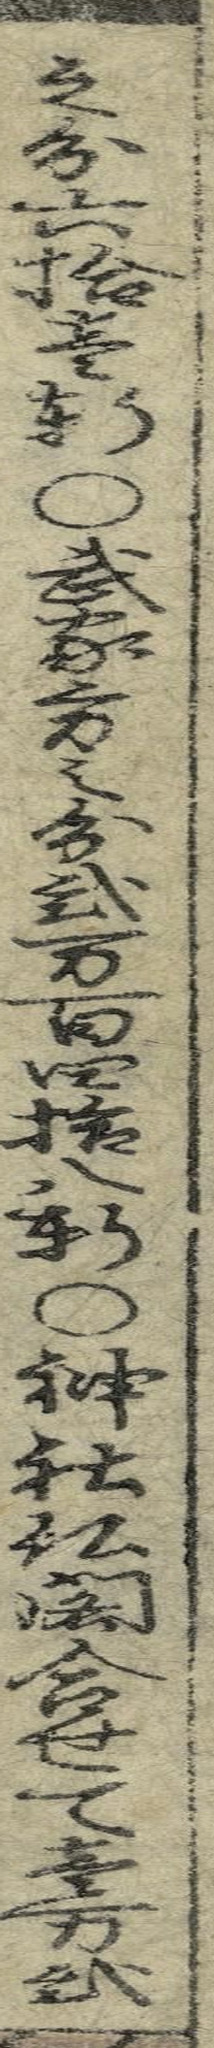の分六拾壹軒○武家方の分弐万百四拾八軒○神社仏閣合せて壹万弐
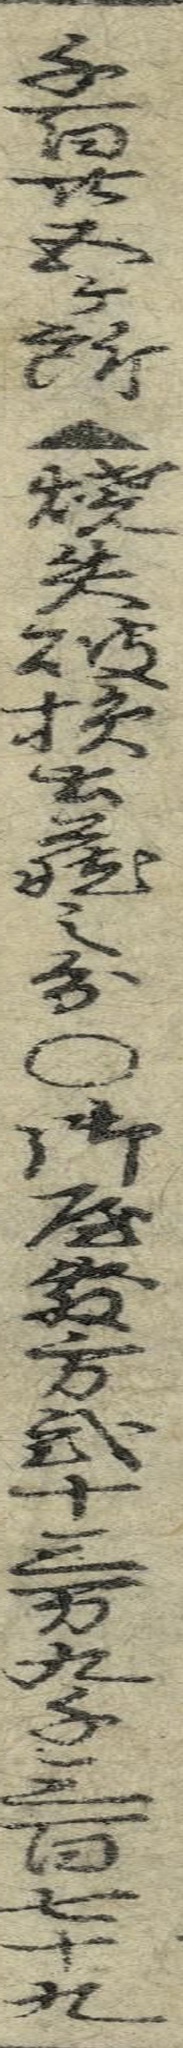千百廿五ヶ所▲焼失破損土蔵の分○御屋敷方弐十三万九千三百七十九
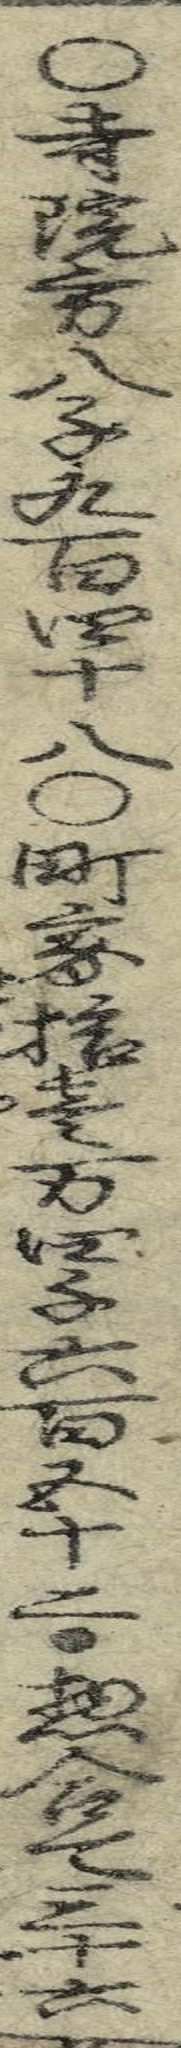○寺院方八千九百四十八○町家拾壹万四千六百五十二・惣合て三十六
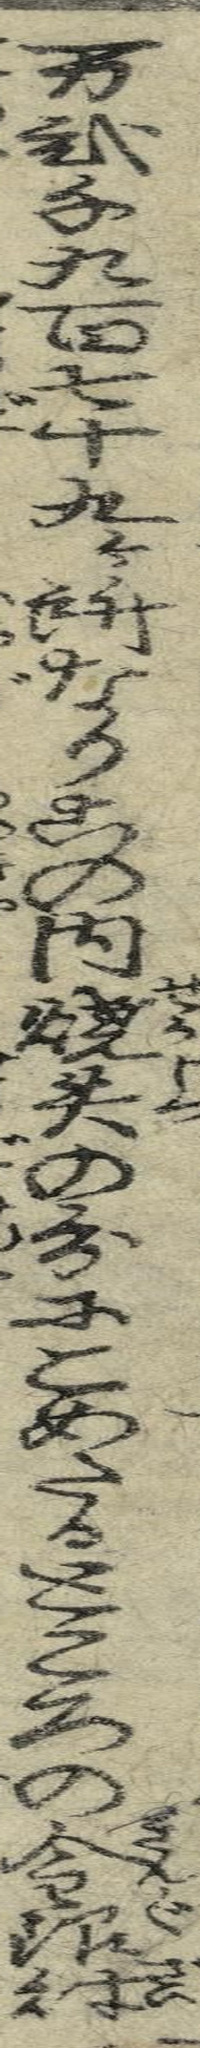万弐千九百七十九ヶ所なりこの内焼失の分にこめたるところの金銀財
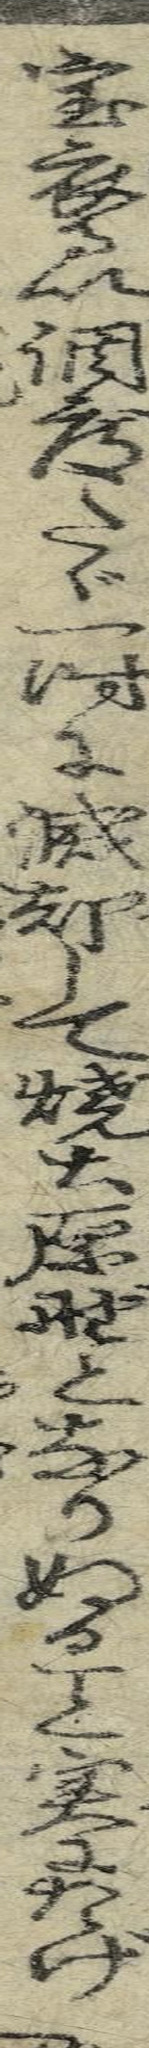宝衣るい調度たゞ一時に滅却して焼土原野となりぬること実になげ
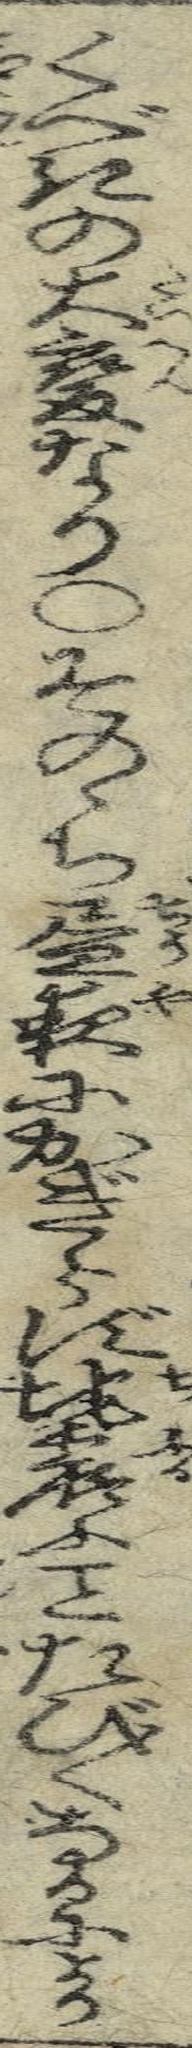くべきの大変なり○そのゝち昼夜にかぎらず地震ふことたび〳〵なるにより
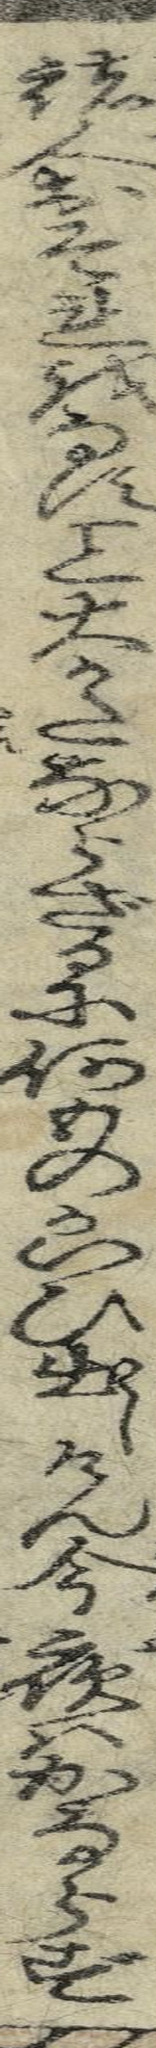諸人おそれをなすこと大かたならざるに何ものかいひ出しけん今夜はかならず
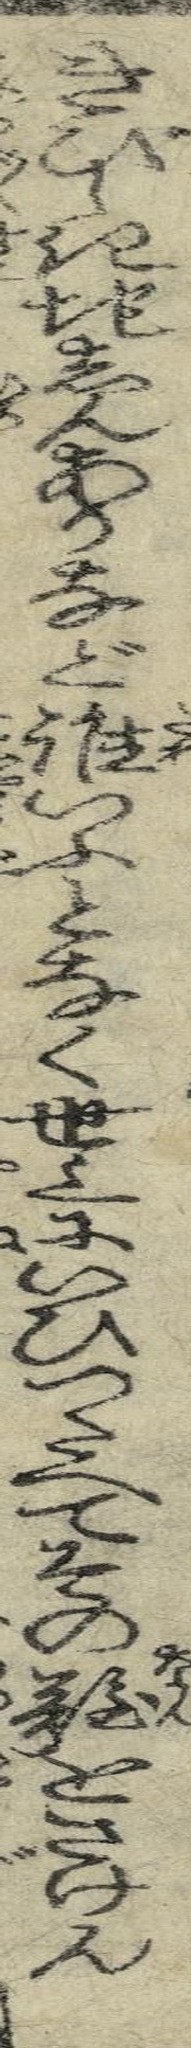きびしき地しんありなど誰いふとなく世上にいひつたへてその難をさけん
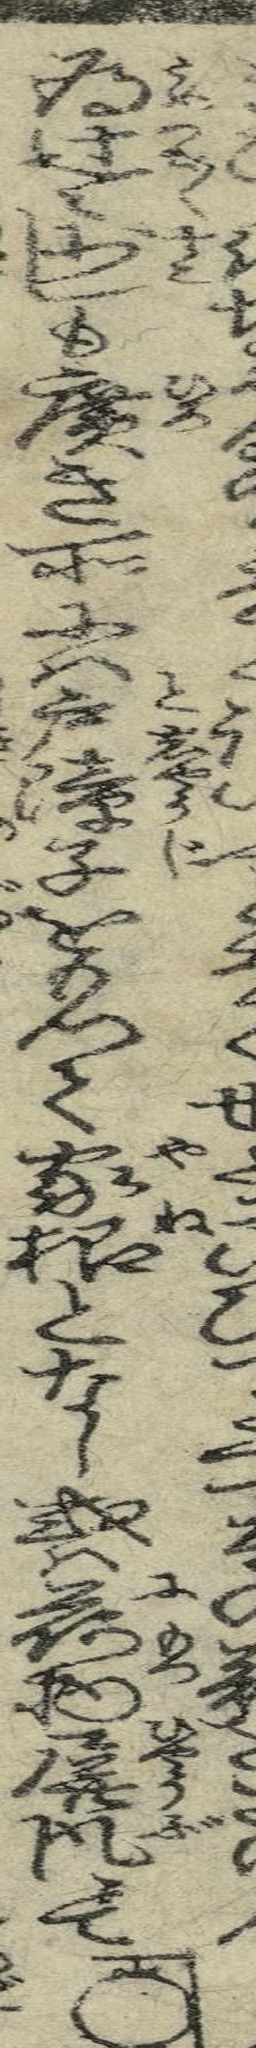為辻〻少しも廣き所には戸障子をもつて家根となし或ハ荷物屏風にて
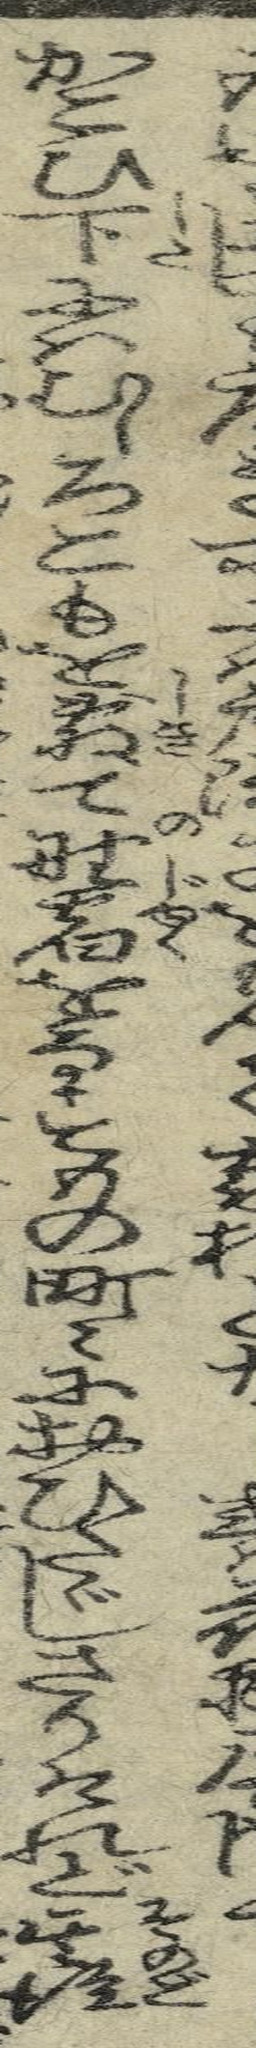かこひ下にはむしろこもを敷て野宿をなすもの町〻におひたゞしさりけれど其後
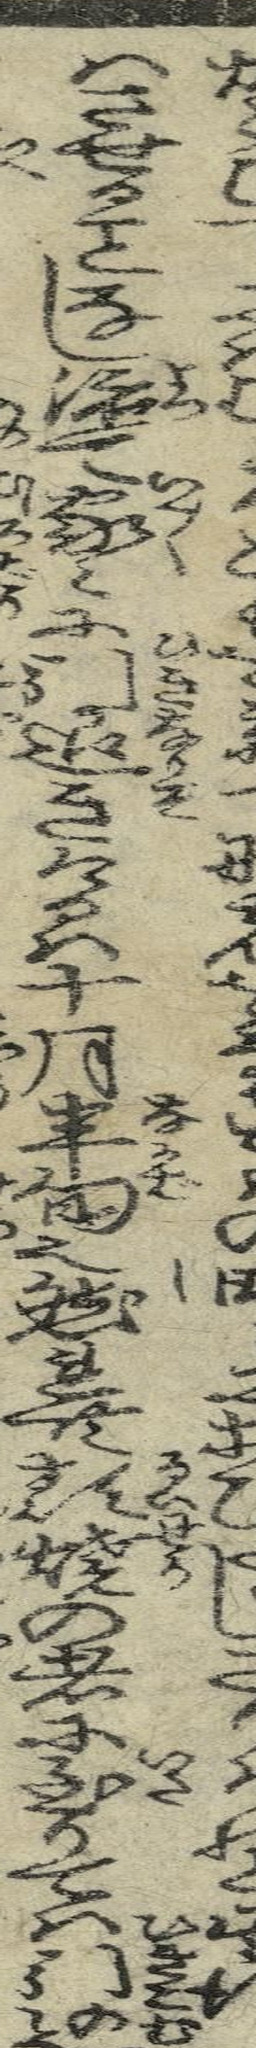はさせることなし依て家〻に引退きけるハ十月半旬也然れ共類焼の者に至りてハ引込
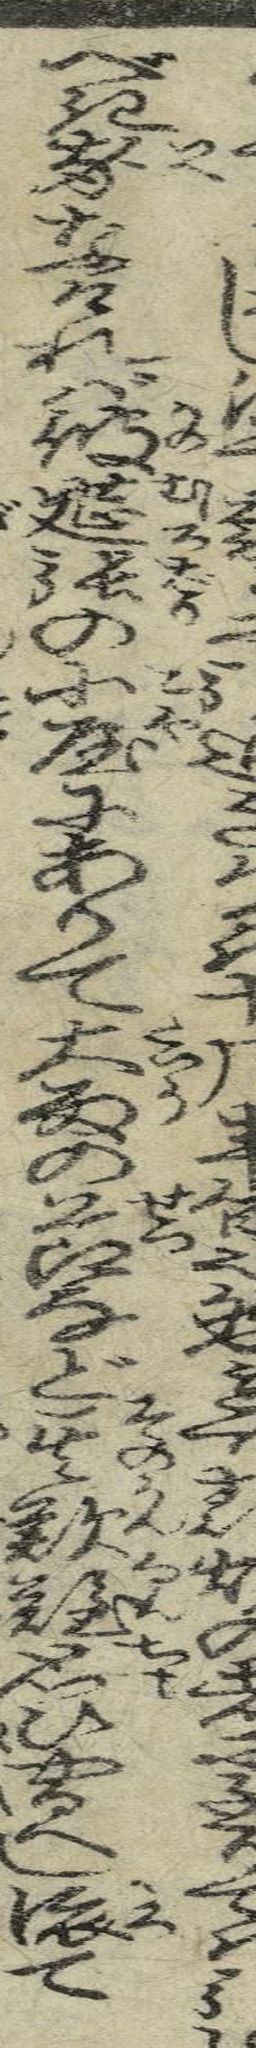べき家なけれバ彼莚張の小屋にありて大雨の節など其艱難思ひやるへし依て
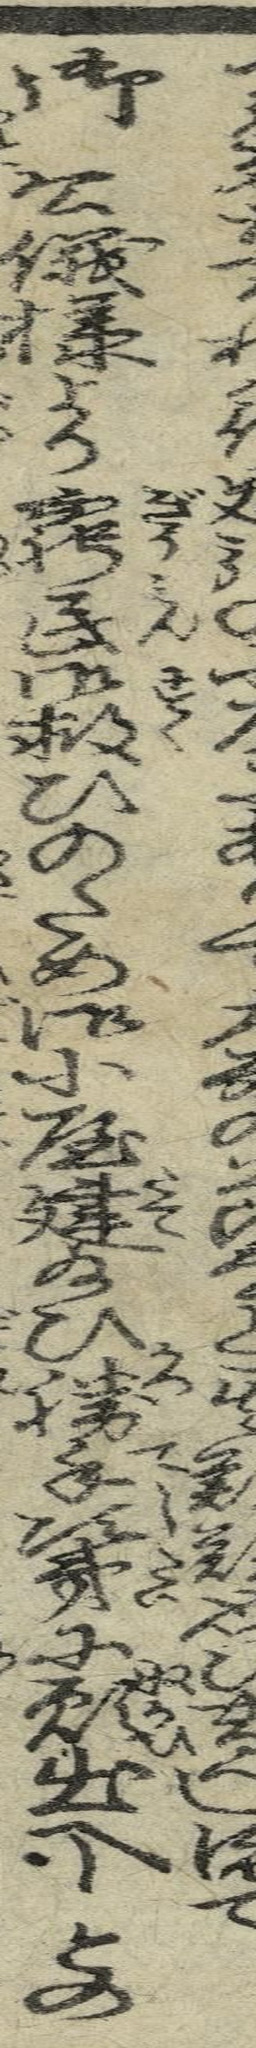御公儀様より窮民御救ひのため御小屋建給ひ勝手次第に願出へしとの
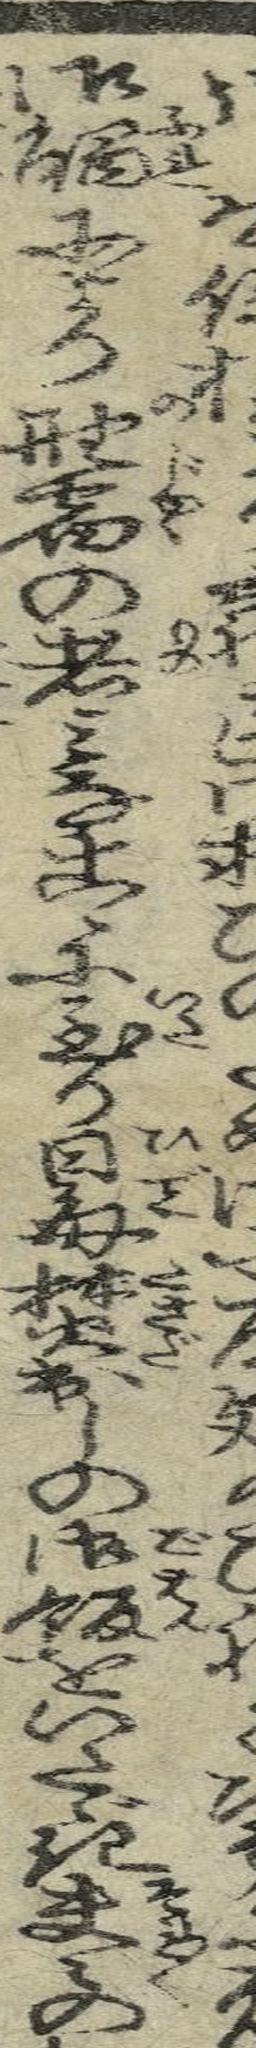御触により野宿の者みなこゝに至り日毎焚出しの御飯をいたゞき夫〻の
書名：地震並出火細見記
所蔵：東京大学地震研究所図書室 Earthquake Research Institute Library, The University of Tokyo, JAPAN
